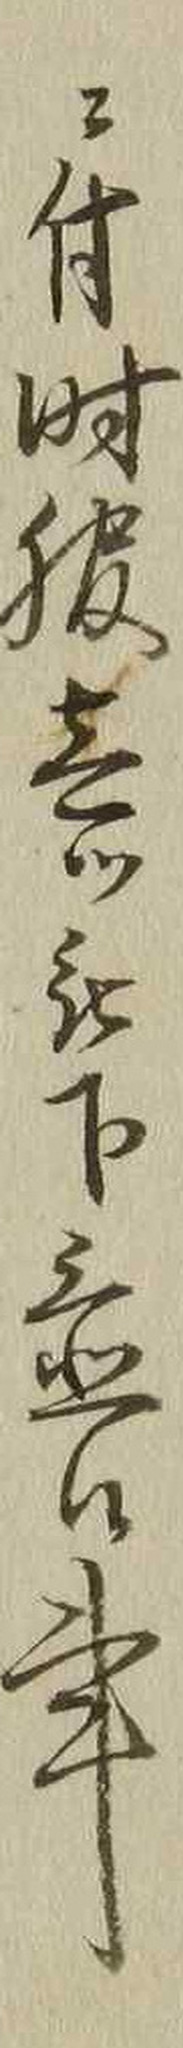二付時服壱ツ被下置候事
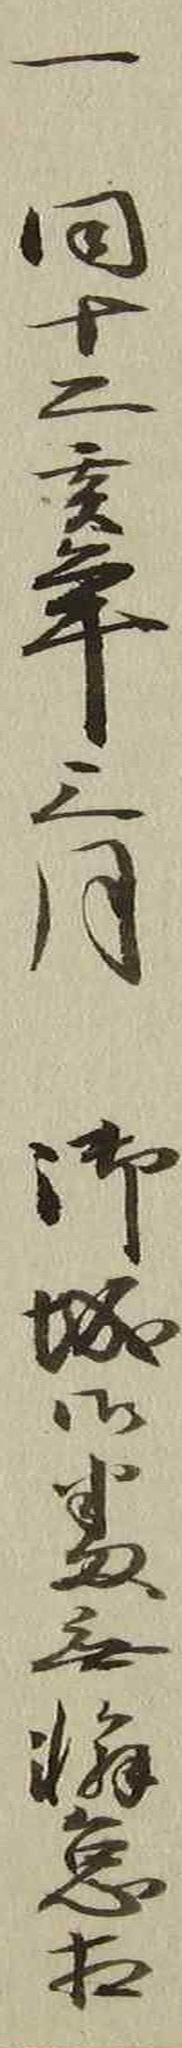一同十二亥年三月御城御番無懈怠相
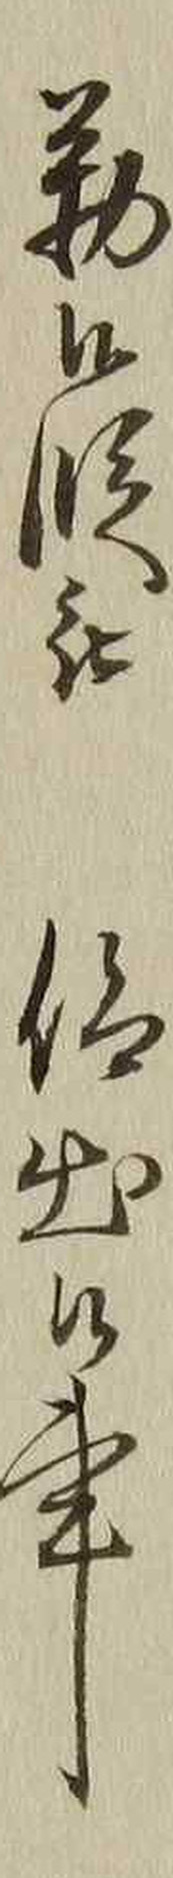勤候段被仰出候事
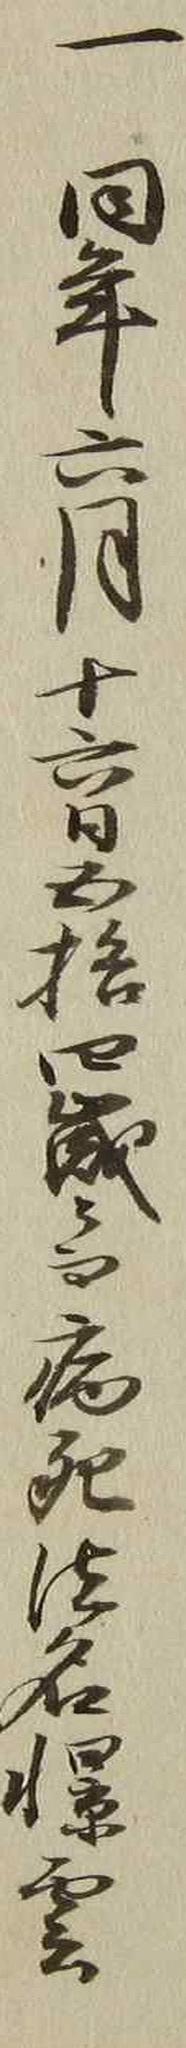一同年六月十六日五拾四歳ニ而病死法名憬雲
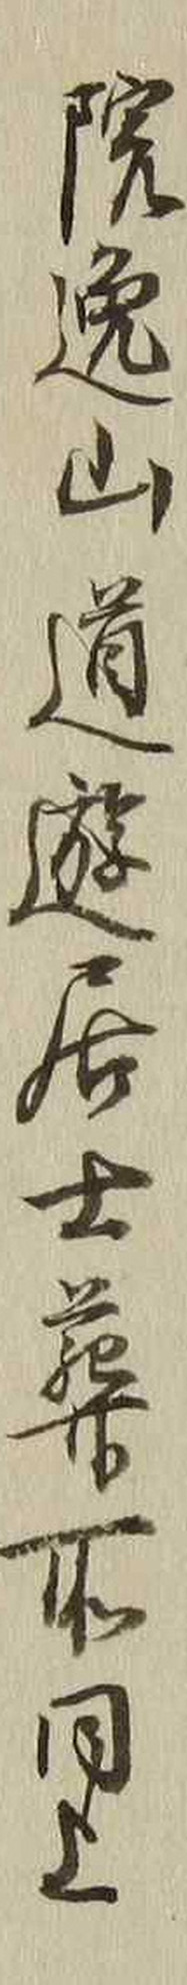院逸山道遊居士葬所同上
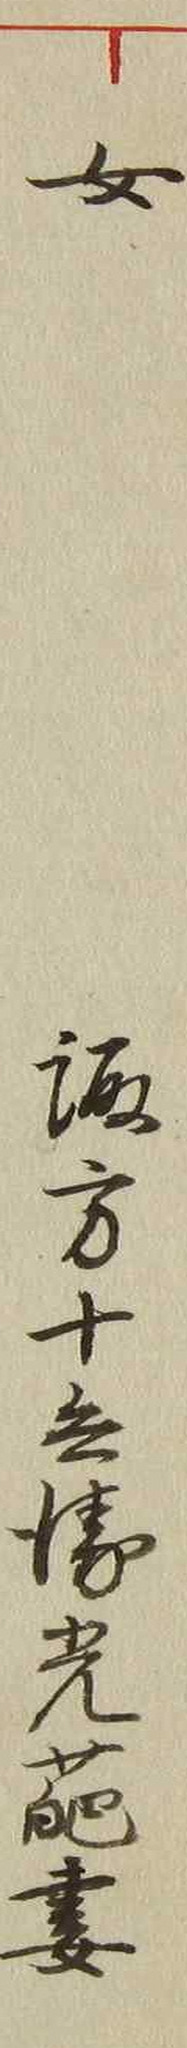女諏方十兵衛光葩妻
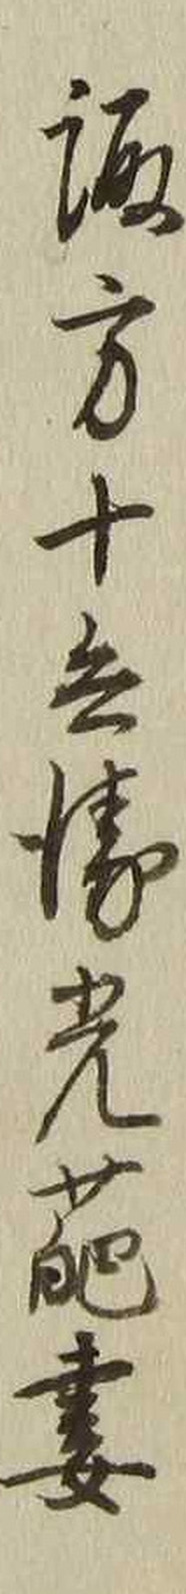女諏方十兵衛光葩妻
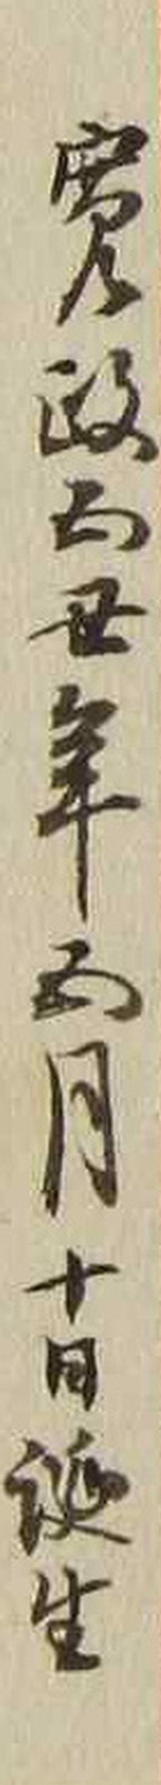寛政五丑年五月十日誕生
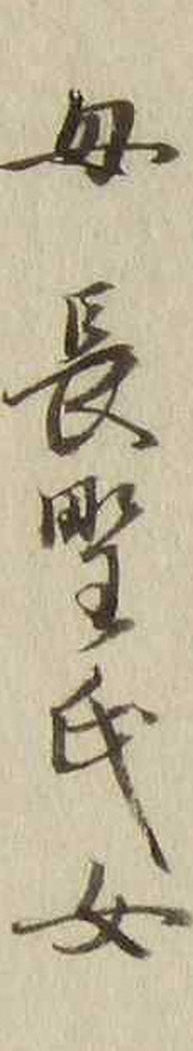母長野氏女

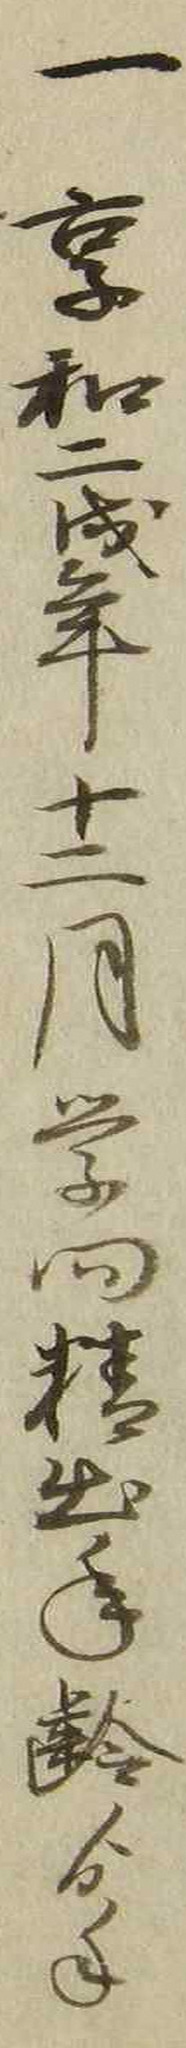一享和ニ戌年十二月学問精出年齢ゟ手
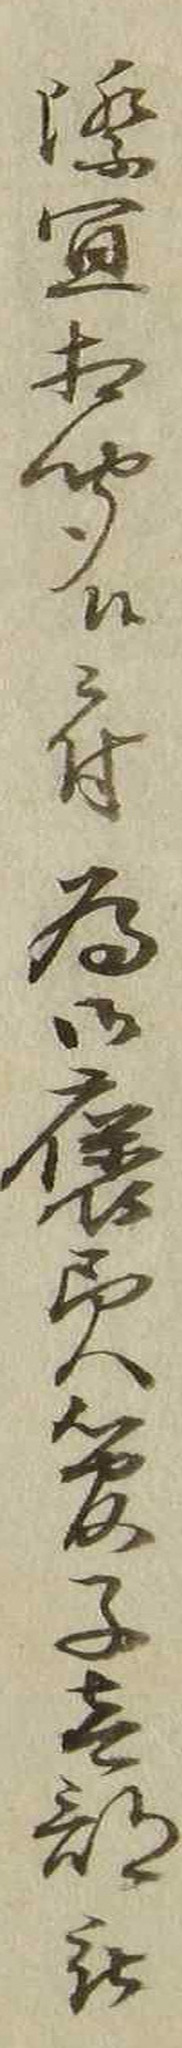際宣相聞候ニ付為御褒美管子壱部被
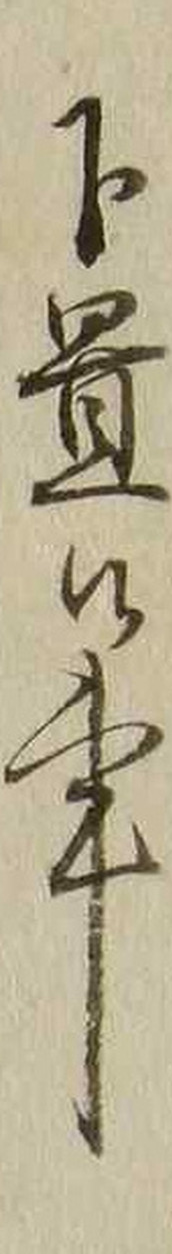下置候事
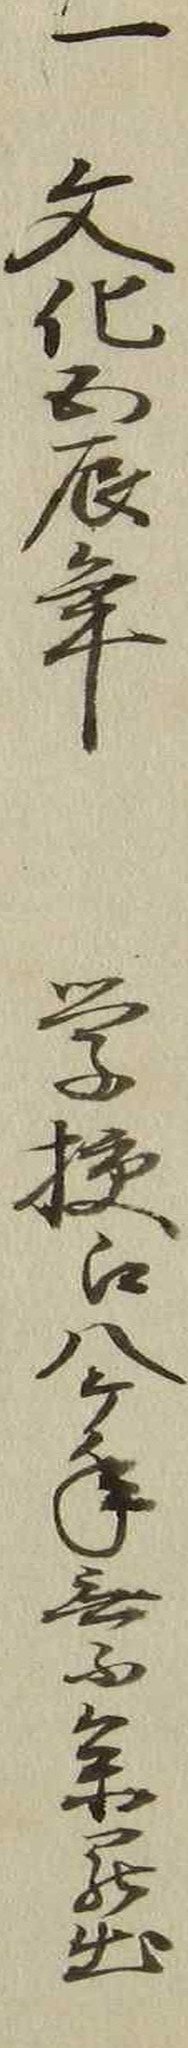一文化五辰年学校江八ヶ年無ふ参罷出
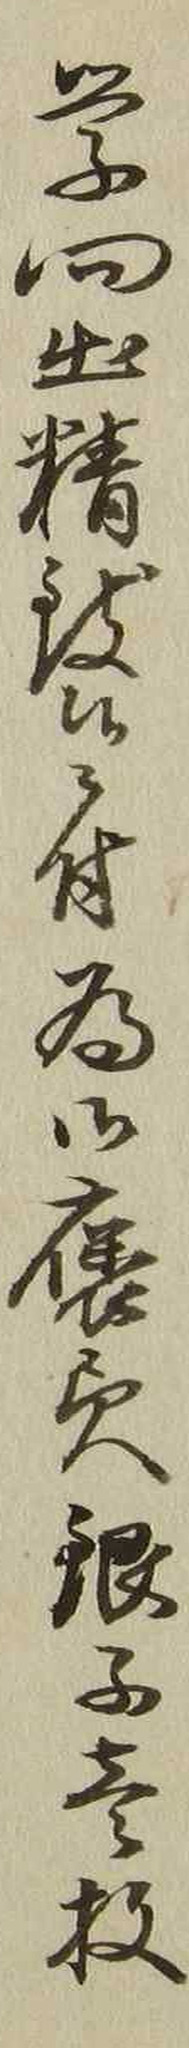学問出精致候ニ付為御褒美銀子壱枚
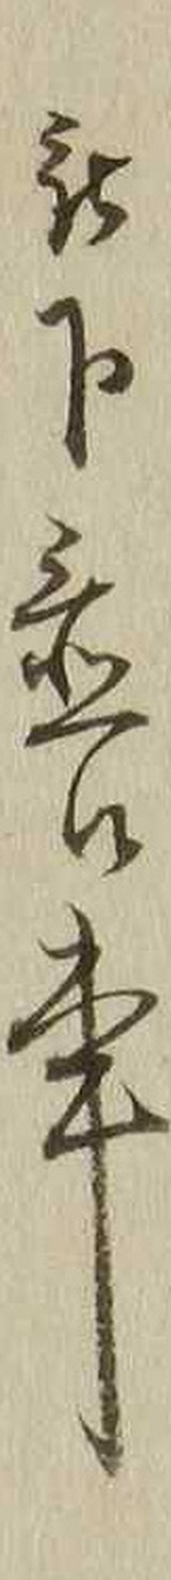被下置候事
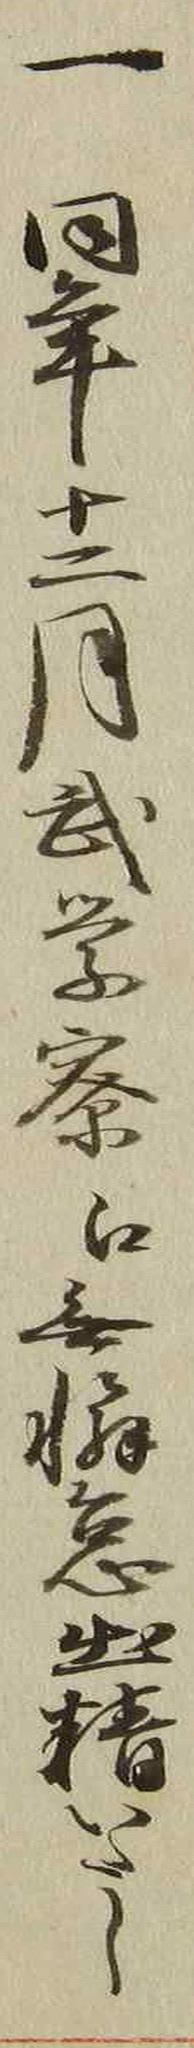一同年十二月武学寮江無懈怠出精いたし
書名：諸士系譜　巻之114　か之部22
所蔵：会津若松市立会津図書館
